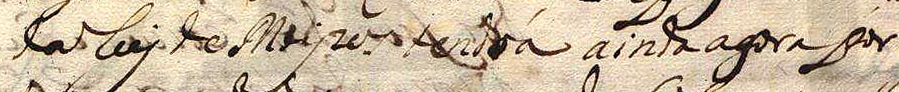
da lej de Moyzes tendoa ainda agora por
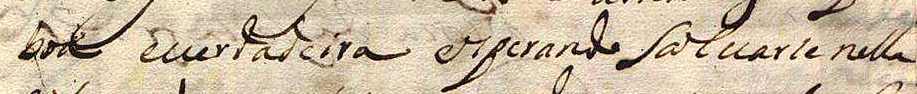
boa e uerdadeira esperando saluarse nella
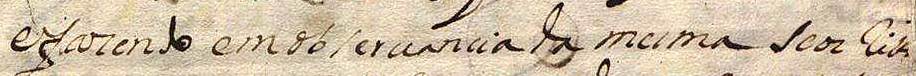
e fazendo em obseruancia da mesma seos Rit
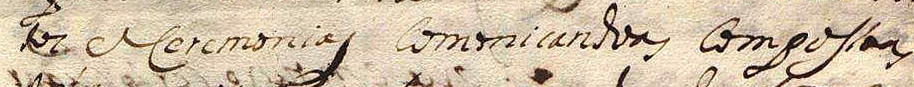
tos e Ceremonias Commicandoas Com pessoas
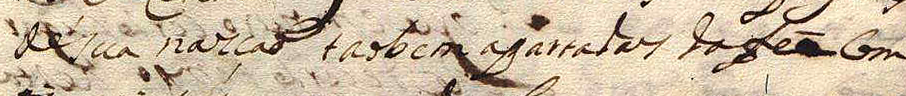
de sua nazçaõ taobem apartadas da feé Com
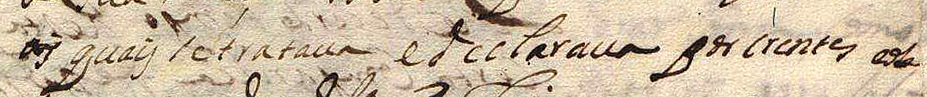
as quais se trataua e declaraua por crentes e ob
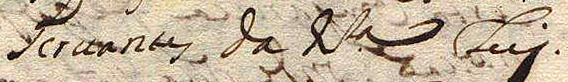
seruantes da d.ta Ley.
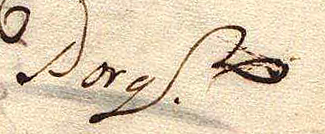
Porq.to
